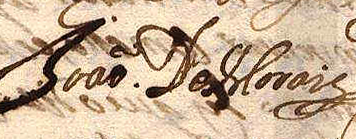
Joaõ De Morais
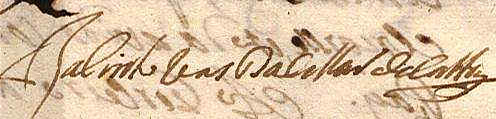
JaCinto vas Bacellar de Castro
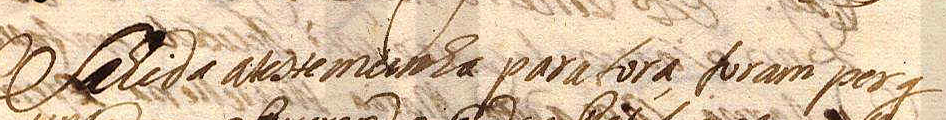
Sahida a testemunha para fora, foram perg
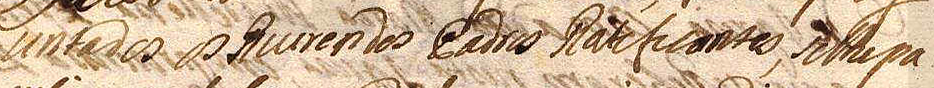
untados os Reurendos Padres Ratificantes se lhe pa
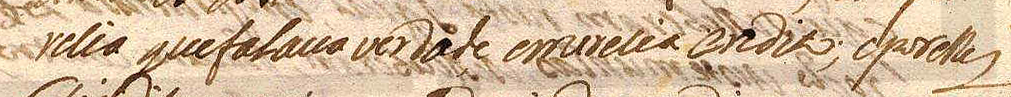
recia que falaua verdade e merecia credito; e por elles
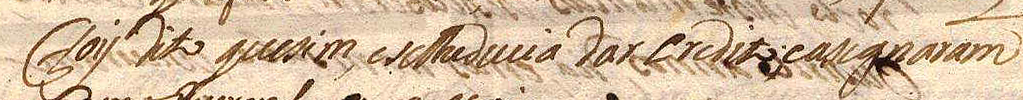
foy dito que sim, e se lhe deuia dar credito, e asignaram
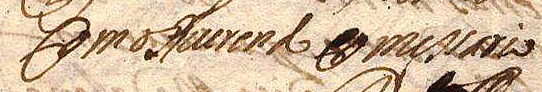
Com o Reurendo comessario
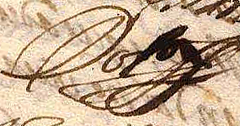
Do sto
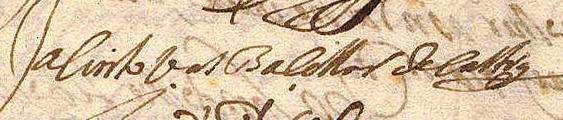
JaCinto Vas Bacellar de Castro
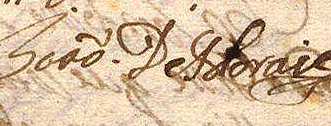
Joaõ De Morais
